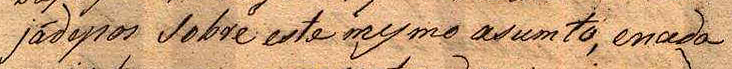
já depos sobre este mesmo asumto, e nada
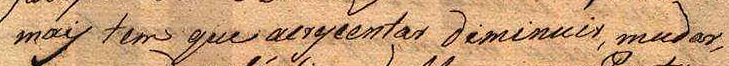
mais tem que acrescentar diminuir, mudar,
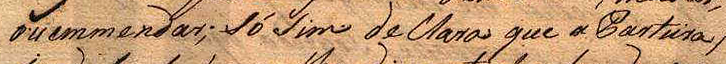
ou emmendar; só sim deClara que a Parteira (
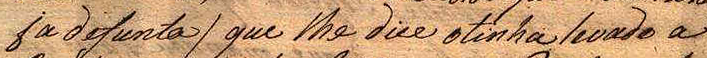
ja defunta) que lhe dice o tinha levado a
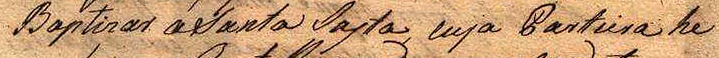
Baptizar a Santa Iusta, cuja Parteira he
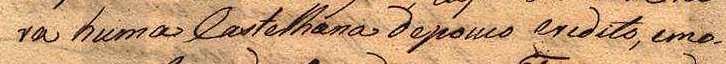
ra huma Castelhana de pouco credito, e mo
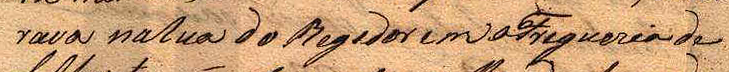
rava na Rua do Regedor em a Freguezia de
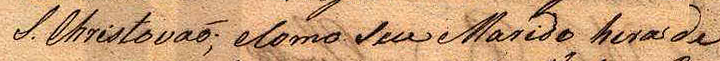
S. Christovaõ; e Como seu Marido hera de
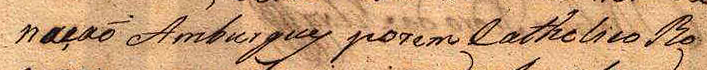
naçaõ Amburgues porem Catholico Ro
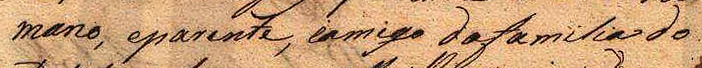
mano, e parente, e amigo da familia do
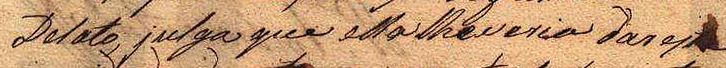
Delato, julga que ella lhe veria dar esta
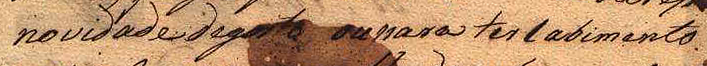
novidade de gosto, ou para ter cabimento.
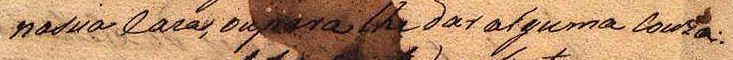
na sua caza, ou para lhe dar alguma couza:
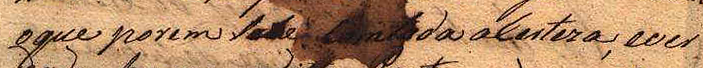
o que porem sabe com toda a certeza, e ver
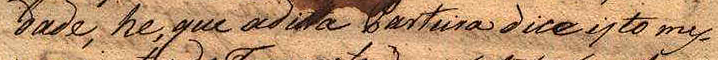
dade, he, que a ditta Parteira dice isto mes
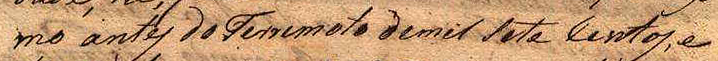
mo antes do Terremoto de mil seteCentos, e
